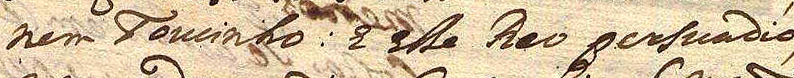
nem Toucinho: E Elle Reo persuadio,
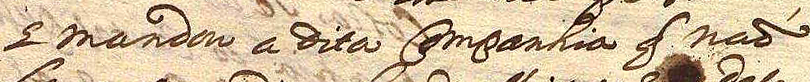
E mandou a dita Companhia q̄ não
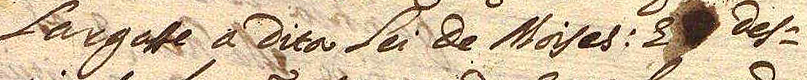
largasse a dita lei de Moises: E des
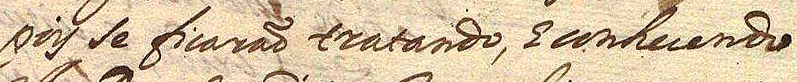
pois se ficaraõ tratando, e conhecendo
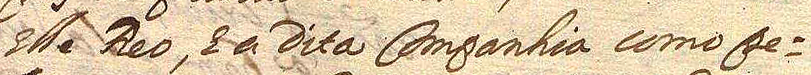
Elle Reo, E a dita Companhia como pe
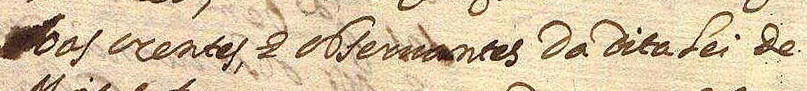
soas crentes, E obseruantes da dita lei de
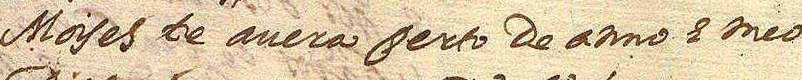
Moises te auera perto de anno E meo
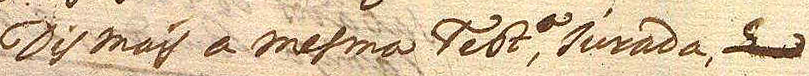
Dis mais a mesma Testa, Iurada, E
